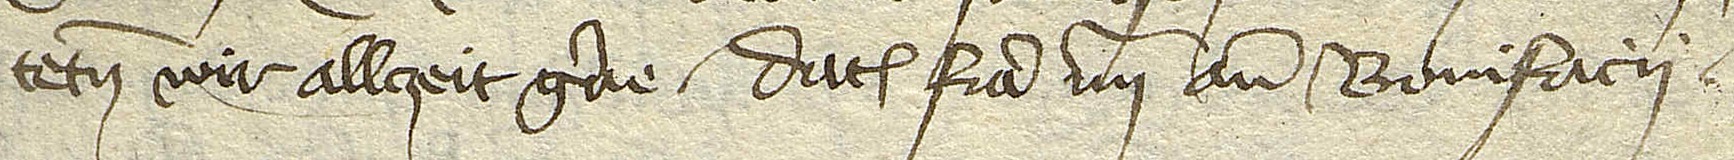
tetn* wir allcʒeit g*ne / dat* fia* iiii* an* Bonifacii /
